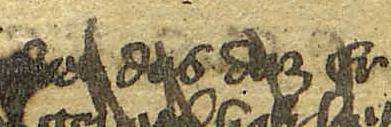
der das daʒ Er
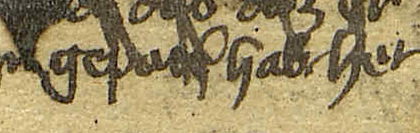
In gepote* hab / het
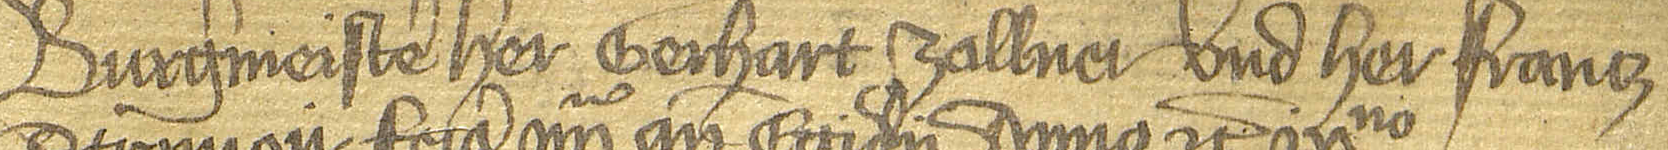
Burg*meiſte* Her Gerhart Cʒollner Vnd Her Francʒ
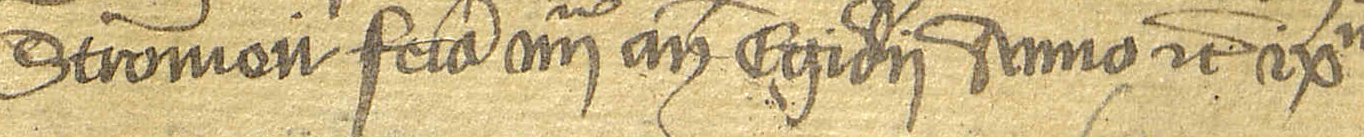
Stromeir feia* iiii* an* Egidii Anno ec* ix*
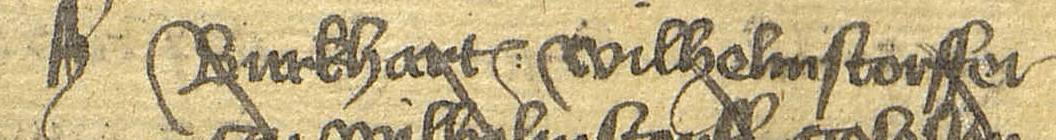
h Burkhart* wilhelmſtorffer
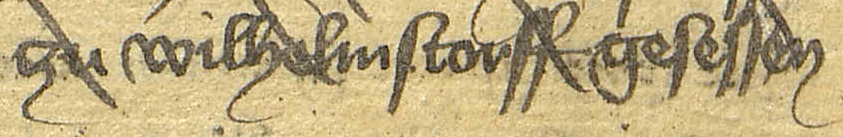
cʒu wilhelmſtorff geſeſſen
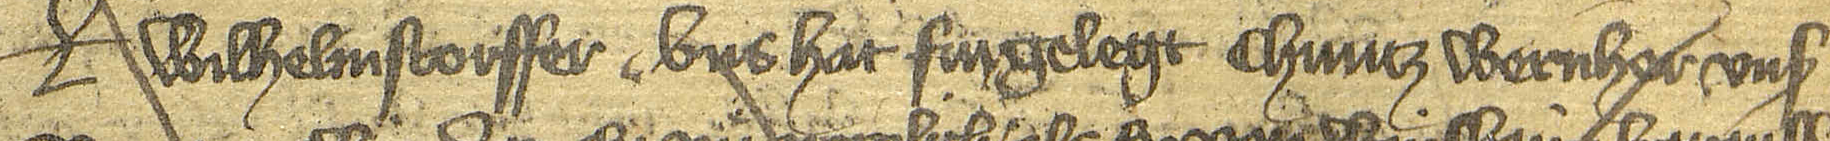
L* Wilhelmſtorffer / vns hat fürgelegt Chuncʒ wernher vnſ*
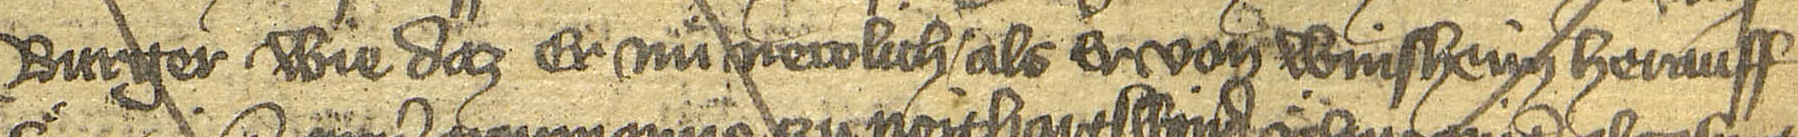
Burger / wie daʒ Er nu newlich / als Er von winſheim herauff
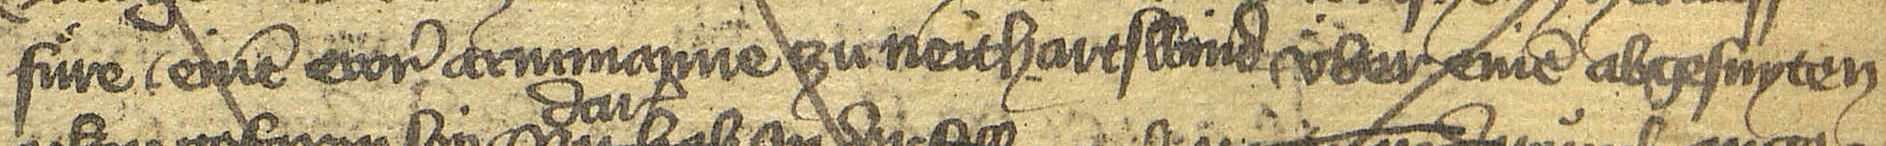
füre / eine* ewr* armmanne cʒu neithartſwind v̈ber eine* abgeſnyten
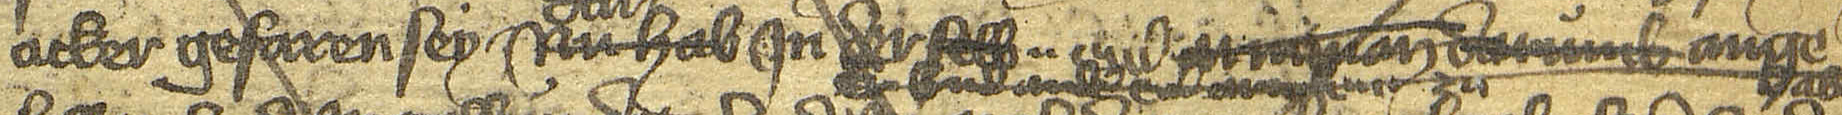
acker gefaren ſey / Nu hab In derſelb ~ armman* darümb ange -
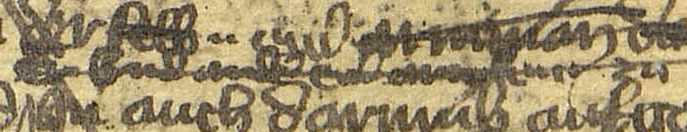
Er vnd ande* ew* armleut ʒu
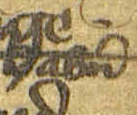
habn*
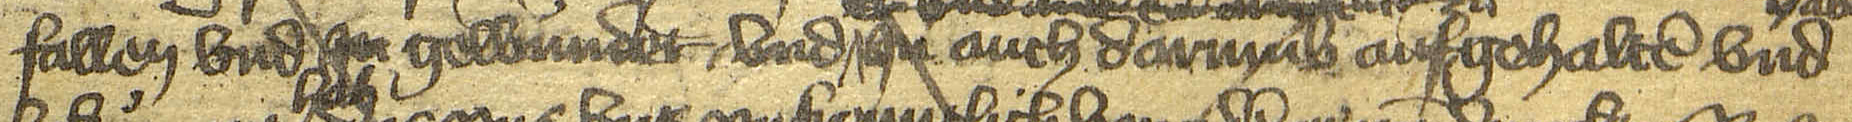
fallen vnd In gewündet / vnd In auch darumb aufgehalte* vnd
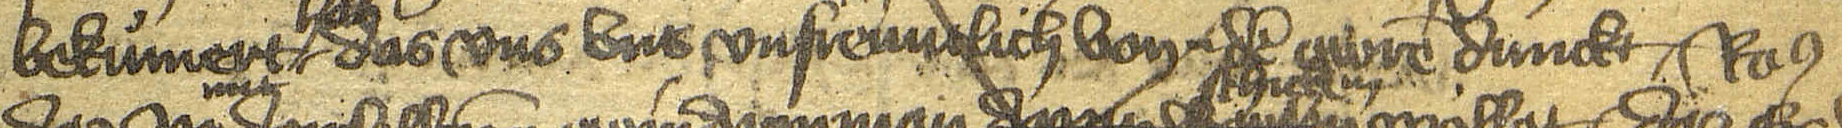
bekümert / das vns vns vnfreuntlich von ~ de* ewre* dunckt / Ro*
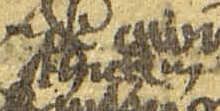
ſchicken
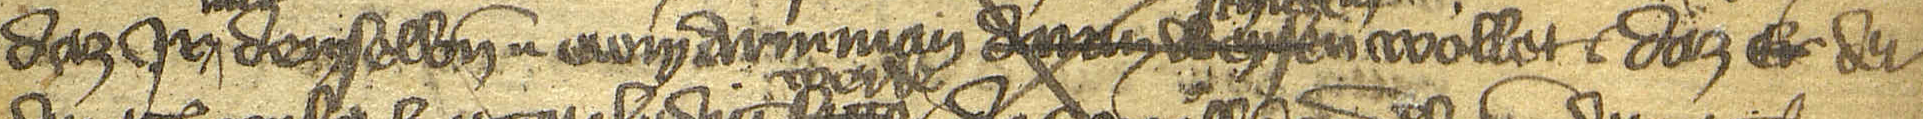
daʒ Ir demſelbn* ~ ewn* Armman daran weyſen wöllet / daʒ Er der
